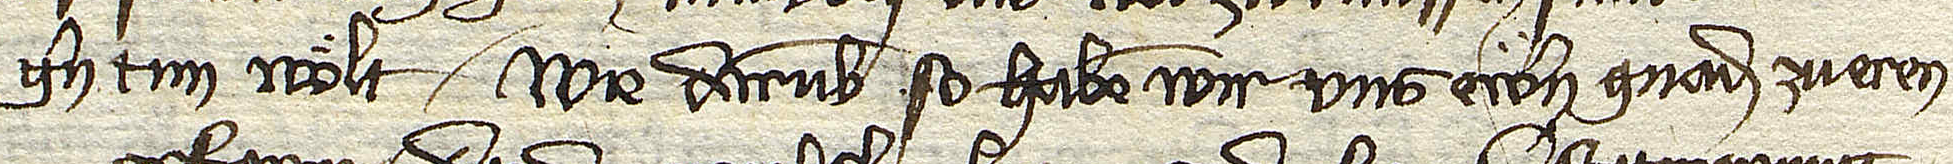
g*n tun wölt / Wie daru*b . ſo habe* wir vns ew*n gnad* ʒu eren
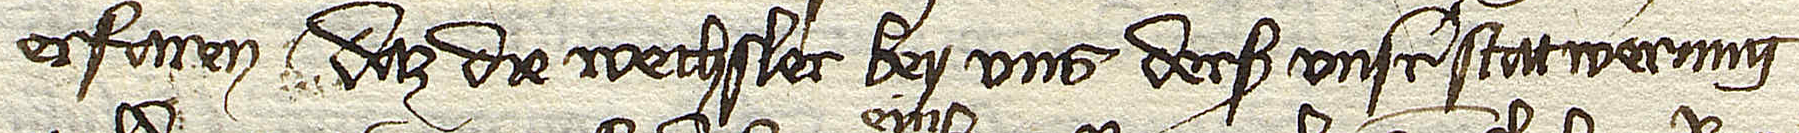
erfaren / Daʒ die wechſler bey vns derſ* vnſ*r ſtatwerung
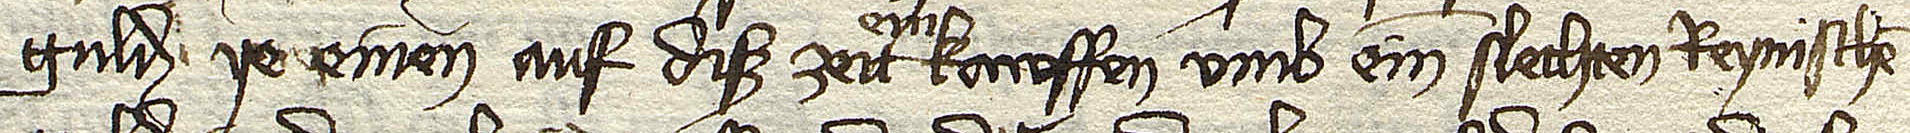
guld* ye einen auf diſʒ ʒeit kawffen vmb ein* ſlechten Reyniſche*
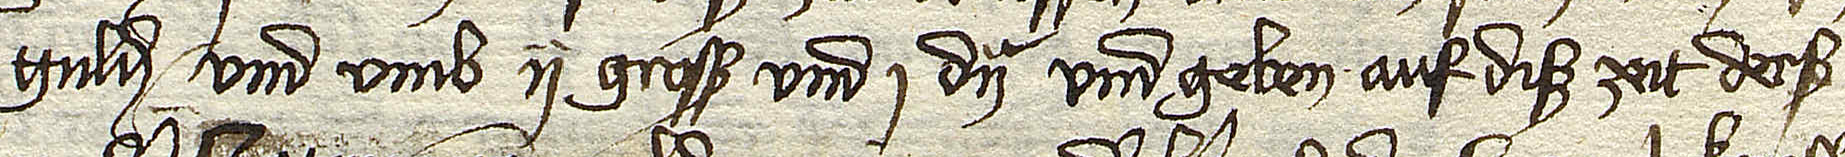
guld* / vnd vmb ii groſſ* vnd i dn* vnd geben auf diſʒ ʒeit derſ*
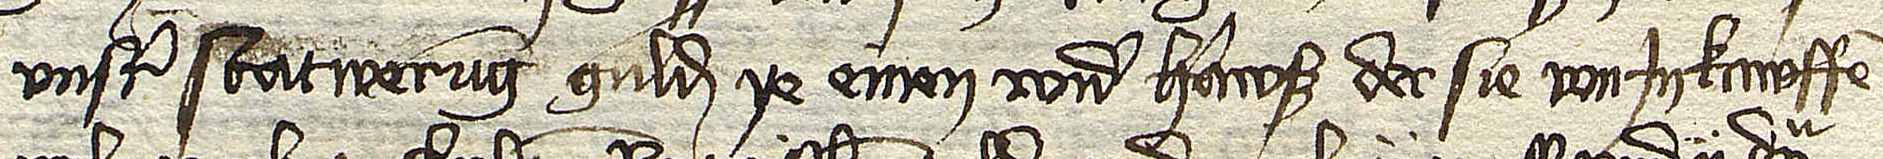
vnſ*r ſtatweru*g guld* ye einen wid* h*awſʒ der ſie von In kawffe*
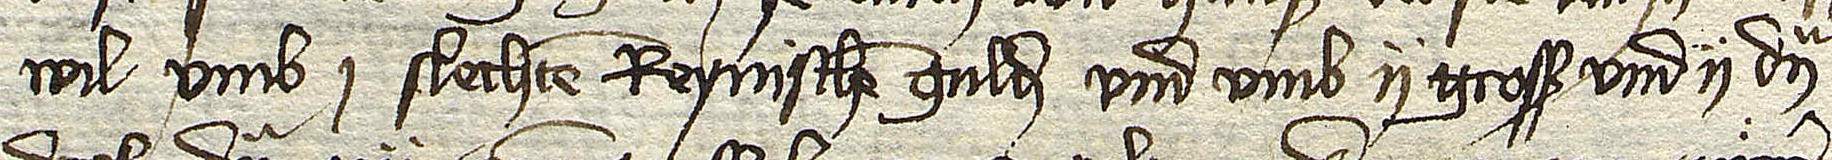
wil vmb i ſlechte* Reyniſche* guld* vnd vmb ii groſſ* vnd ii dn*
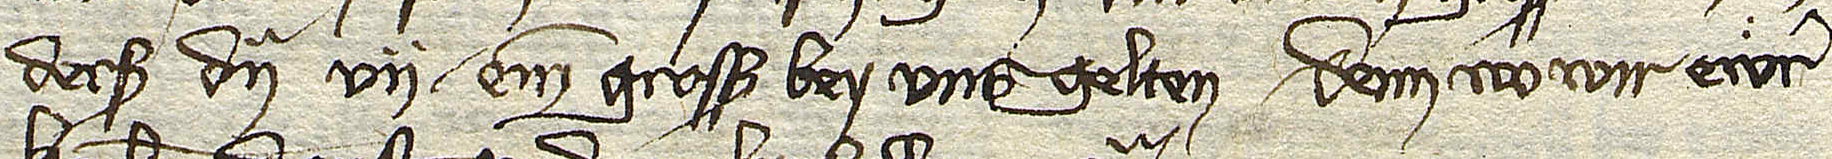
derſ* dn* vii / ein* groſſ* bey vns gelten / Denn wo wir ew*r
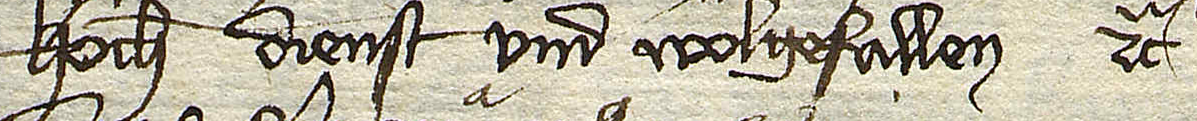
Hoch* dienſt vnd wolgefallen ec*
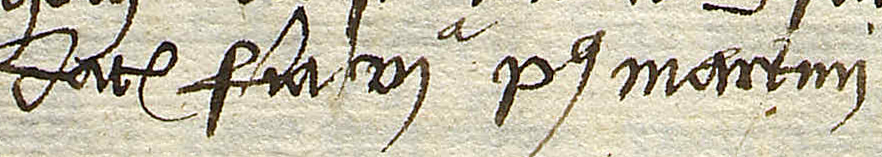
Dat* fia* vi* p* martini
